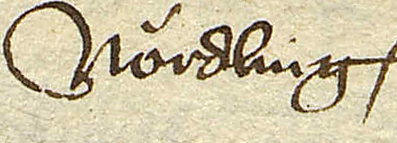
Nördling*
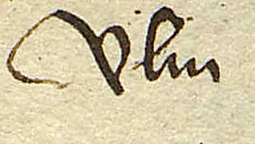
Vlm
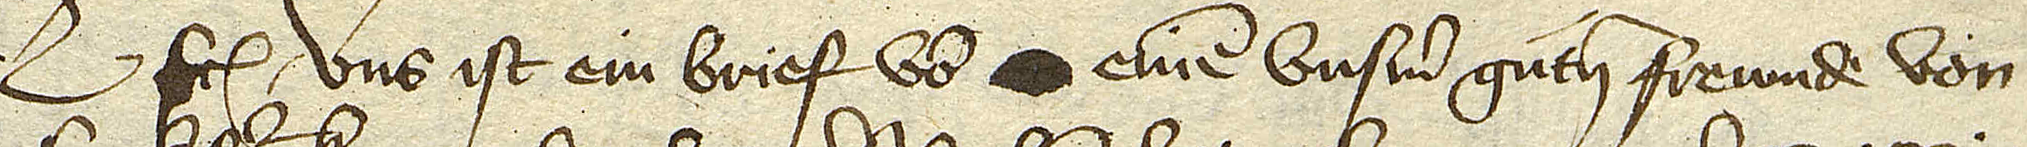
L* fr* / vns iſt ein brief vo* eine* vnſm* gutn* frewnde von
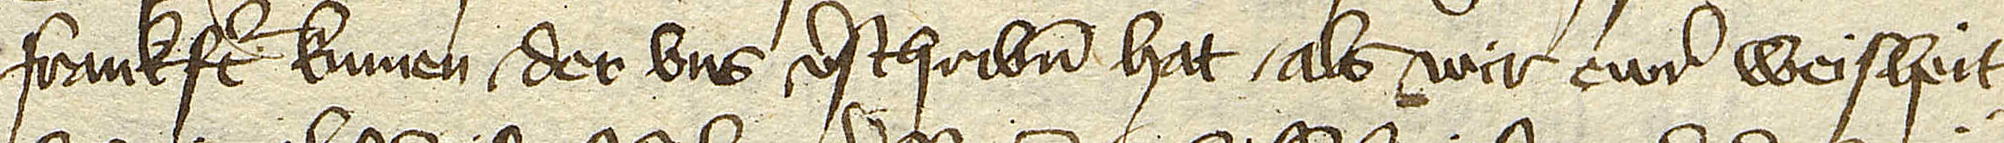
frankf*t kumen / der vns v*ſchribn* hat / als wir ewr* weiſheit
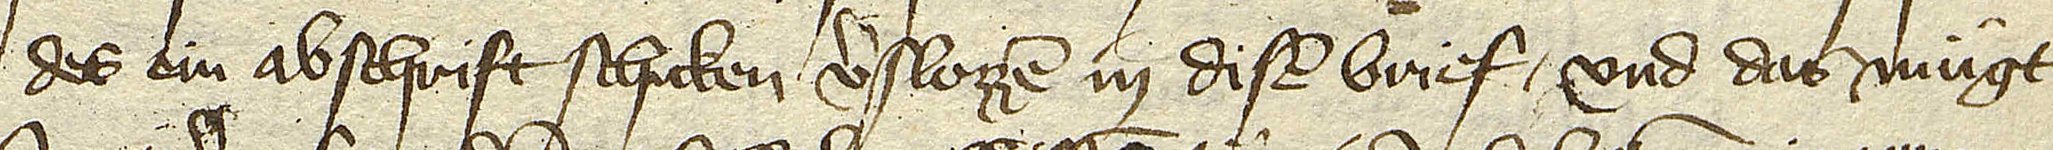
des ein abſchrift ſchicken v*ſloʒʒe* in diſe* brief / vnd das mügt
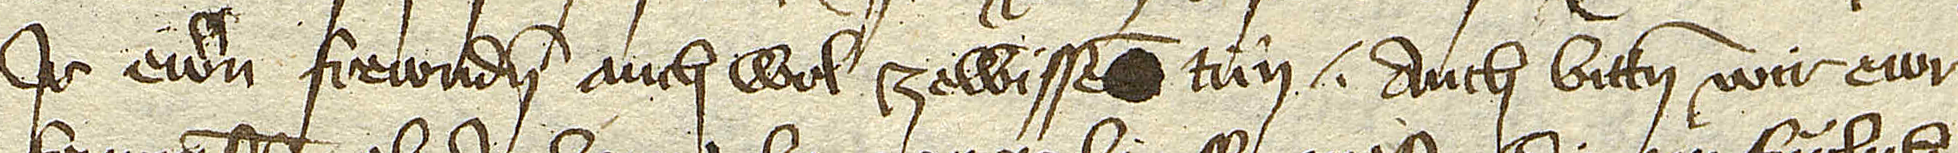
Ir ew*n frewndn* auch wol cʒewiſſe* tün / . Auch bittn* wir ewr
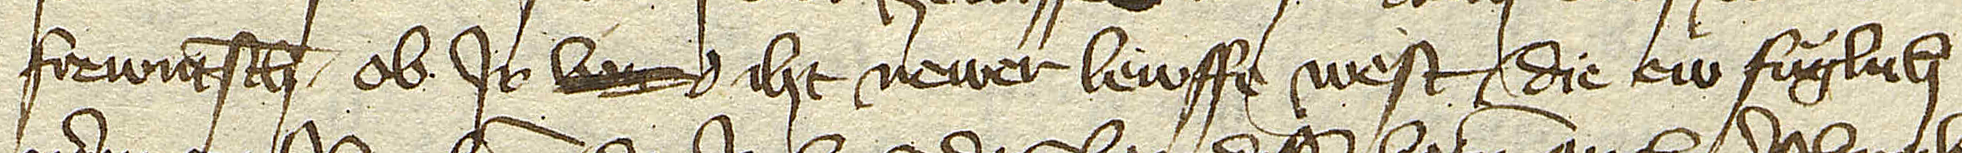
frewntſch* / ob Ir von d iht newer lewffe weſt / die ew füglich
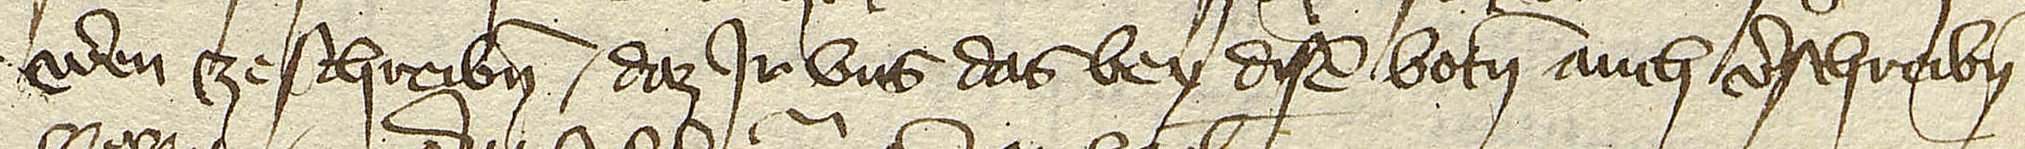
w*en cʒeſchreibn* / daʒ Ir vns das bey diſe* botn* auch v*ſchreibn*
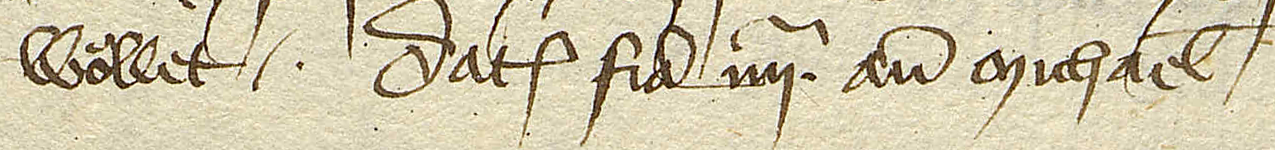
wöllet / . Dat* fia* iiii* . an* Michael /
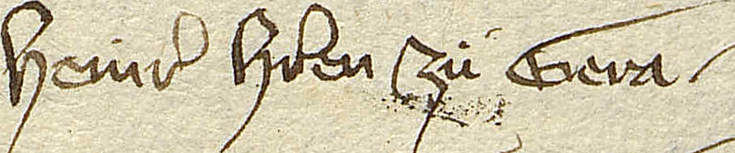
heinr* hr*en cʒü Gera /
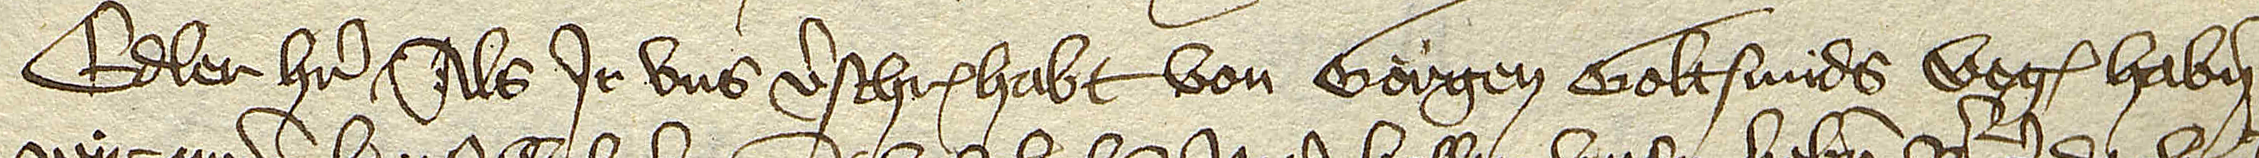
Edler hr* / Als Ir vns v*ſchr* habt von Görgen Goltſmids weg* habn*
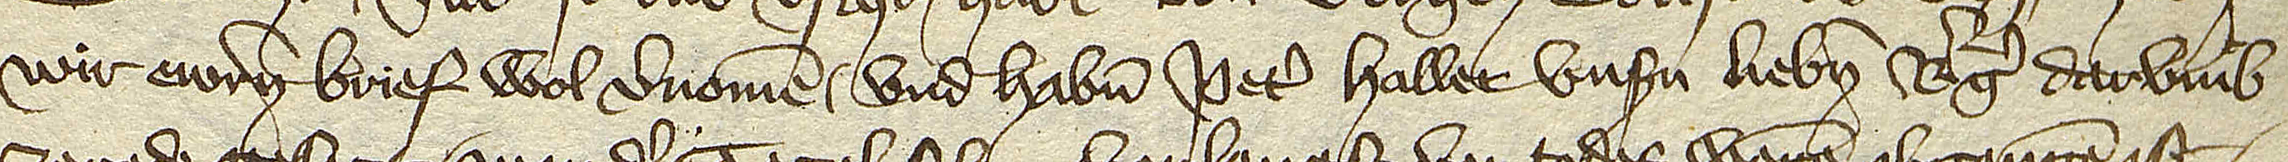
wir ewrn* brief wol v*nome* / vnd habn* Pet* haller vnſ*n liebn* B*g* darvmb
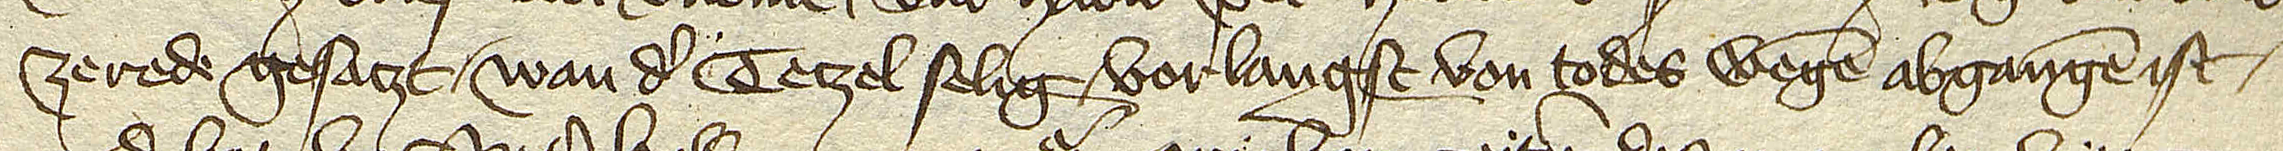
cʒerede geſacʒt / wan d* Tecʒel ſelig / vor langſt von todes wege* abgange* iſt /
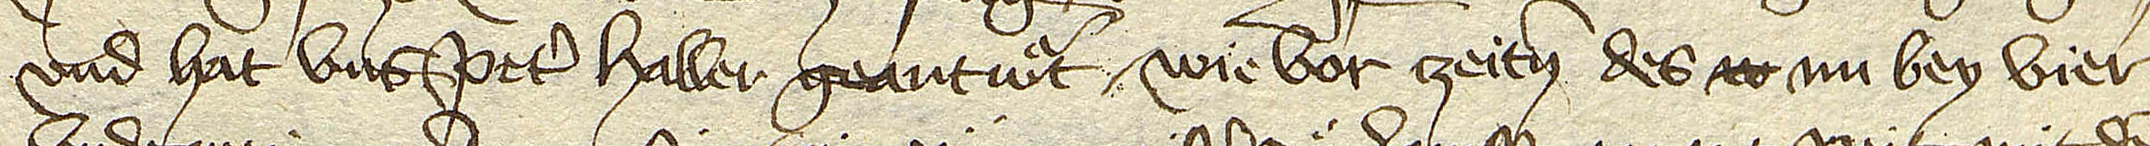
vnd hat vns Pet* haller geantw*t / wie vor cʒeitn* des w nu bey vier
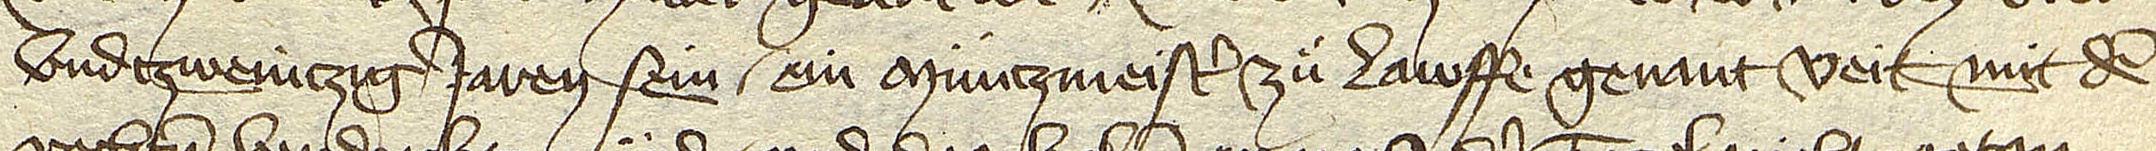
vndcʒweincʒig Iaren ſein / ein Müncʒmeiſt* cʒü Lawffe genant Veit mit d*
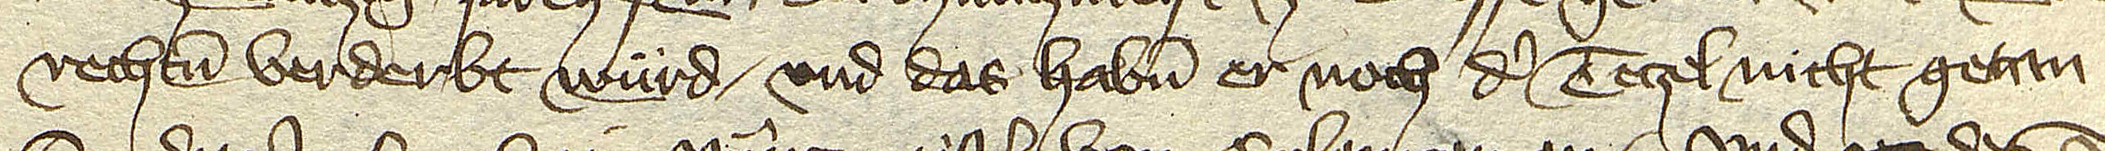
rechtn* verderbt würd / vnd das habn* er noch d* Tecʒel nicht getan
